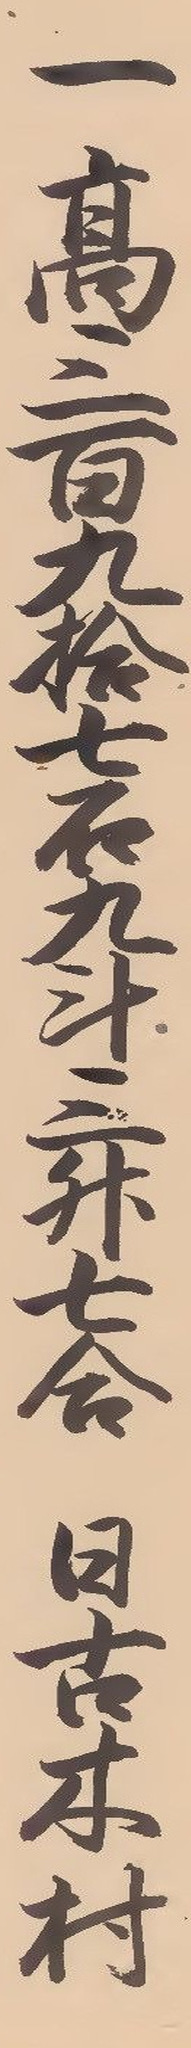一髙三百九拾七石九斗三升七合日古木村
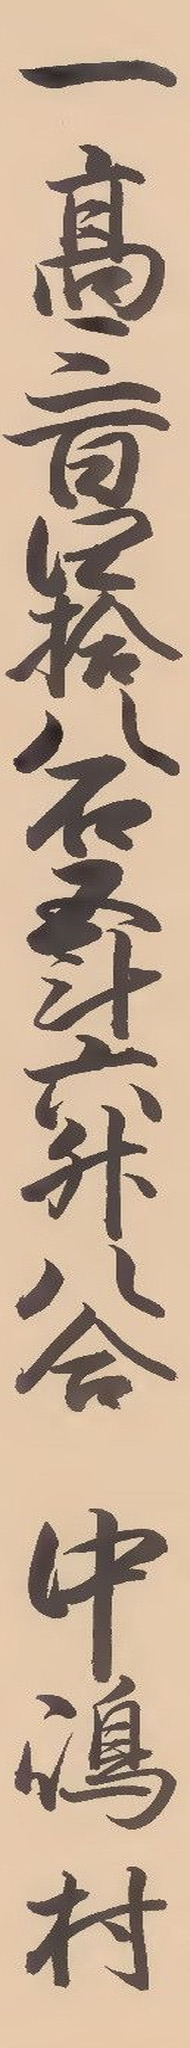一髙三百四拾八石五斗六升八合中嶋村
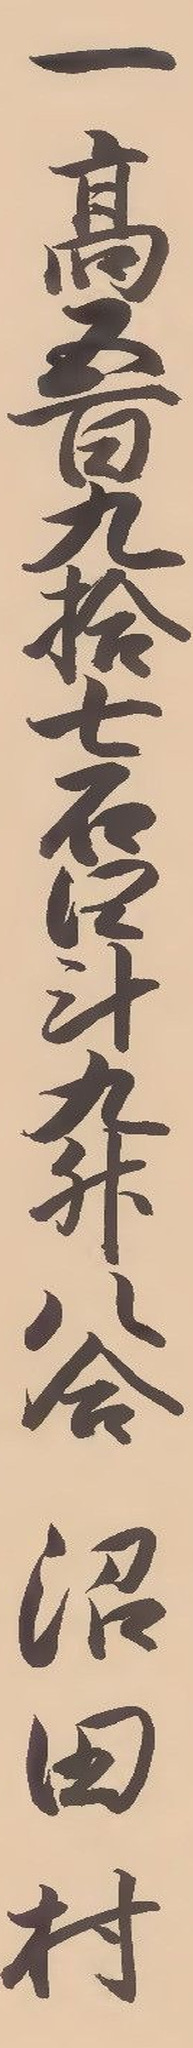一髙五百九拾七石四斗九升八合沼田村
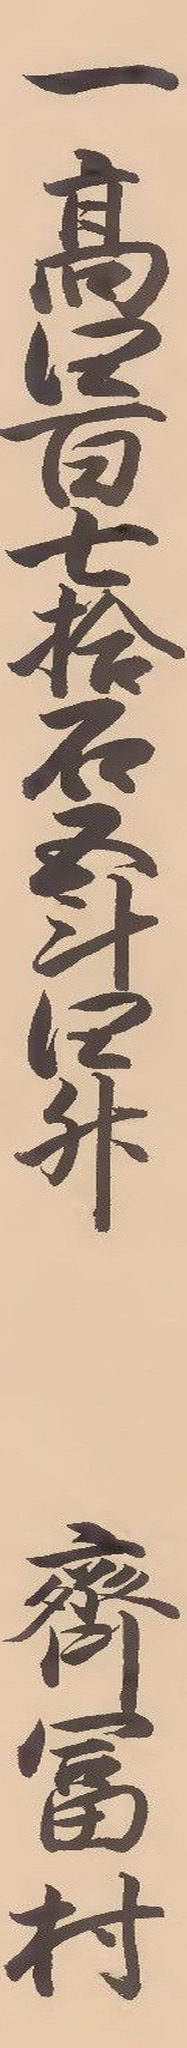一髙四百七拾石五斗四升齊冨村
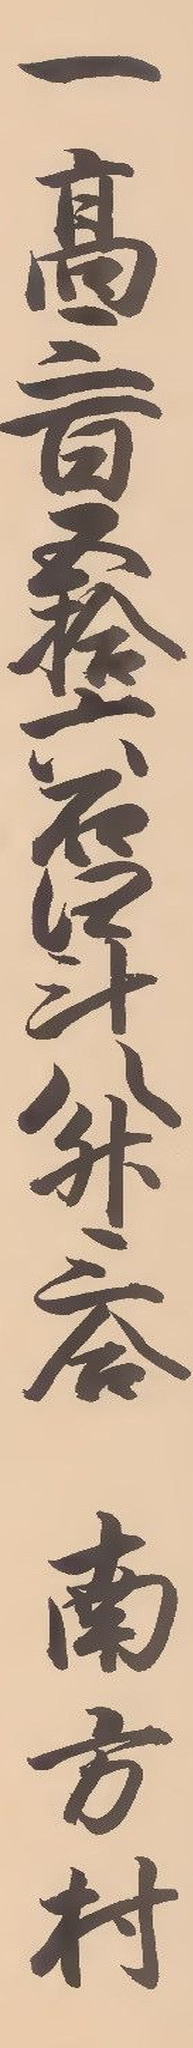一髙三百五拾六石四斗八升三合南方村
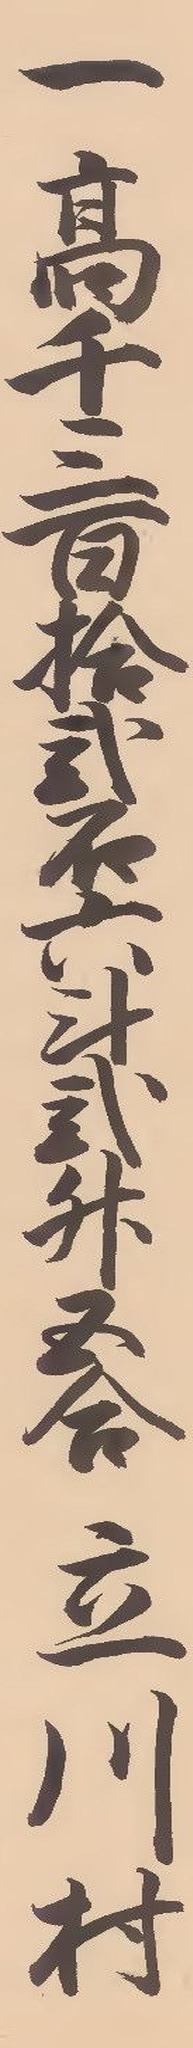一髙千三百拾弐石六斗弐升五合立川村
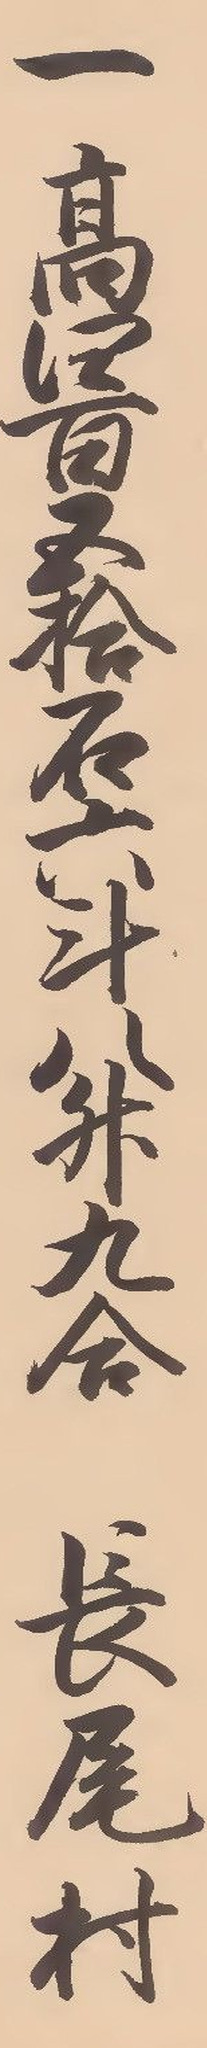一髙四百五拾石六斗八升九合長尾村
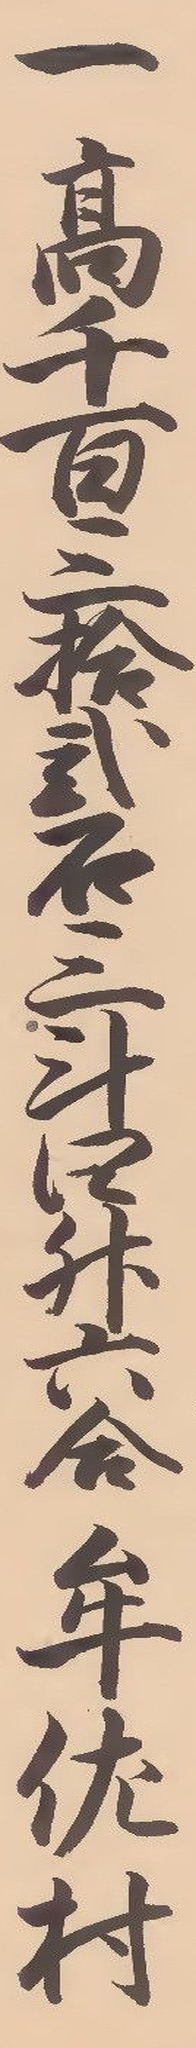一髙千百三拾弐石三斗四升六合牟佐村

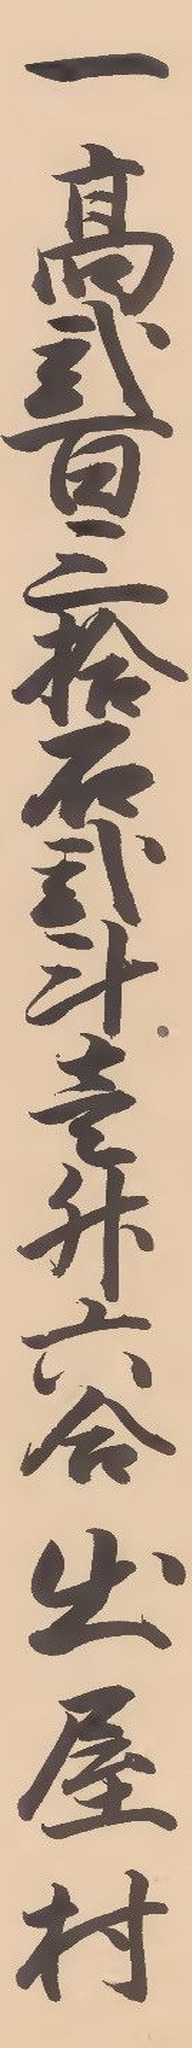一髙弐百三拾石弐斗壱升六合出屋村
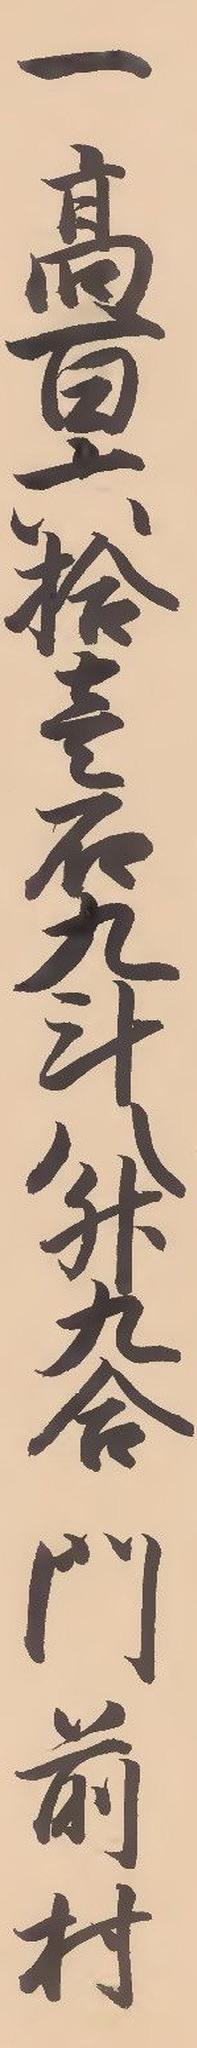一髙百六拾壱石九斗八升九合門前村
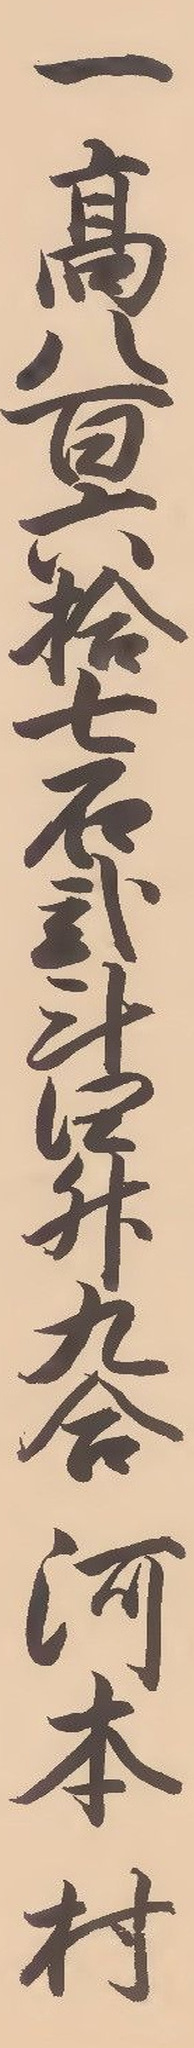一髙八百六拾七石弐斗四升九合河本村
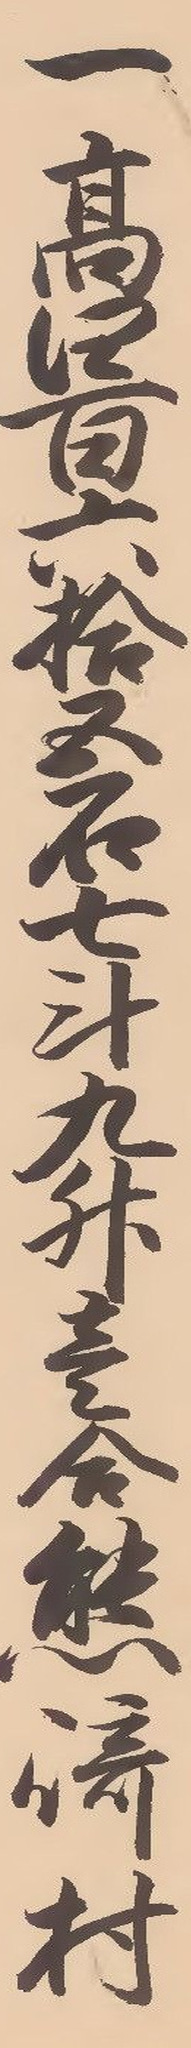一髙四百六拾五石七斗九升壱合熊崎村
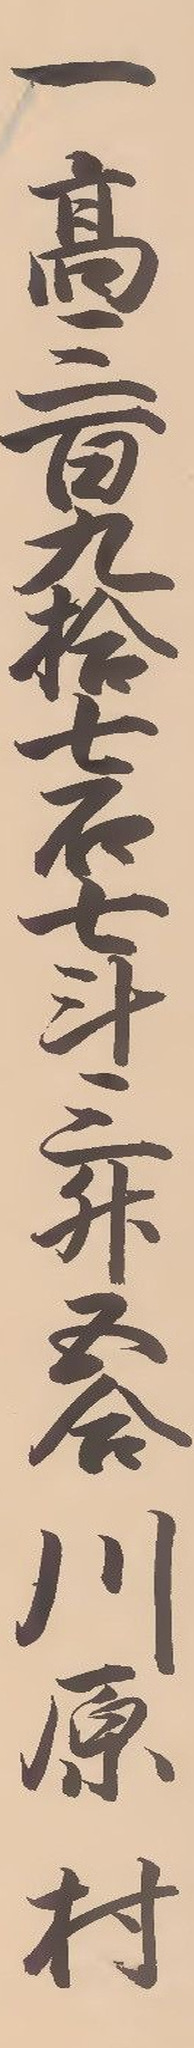一髙三百九拾七石七斗三升五合川原村
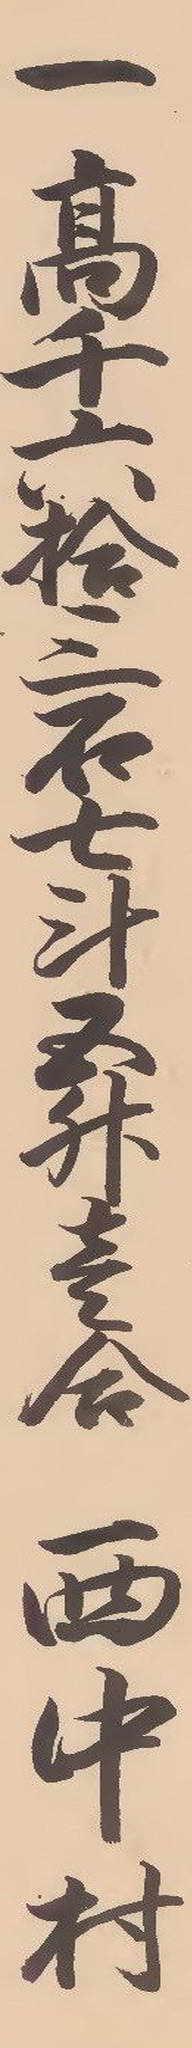一髙千六拾三石七斗五升壱合西中村
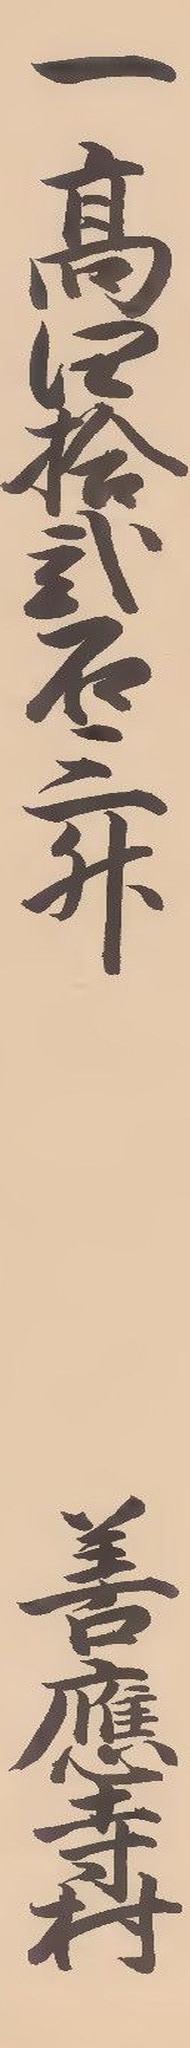一髙四拾弐石三升善應寺村
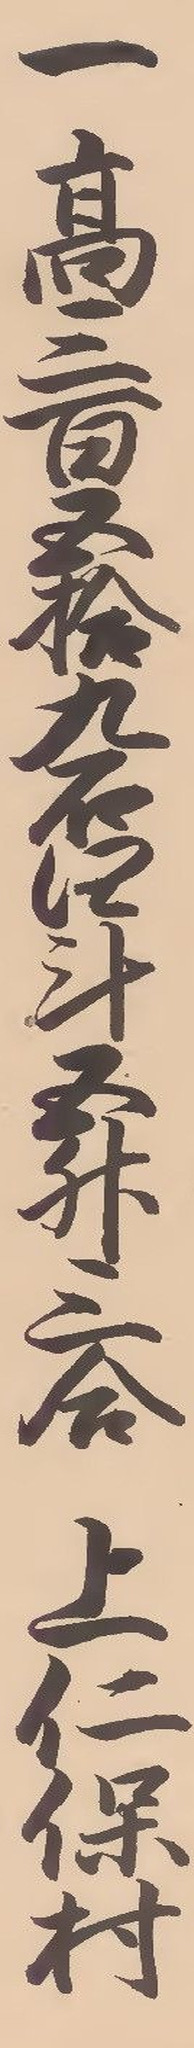一髙三百五拾九石四斗五升三合上仁保村
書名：備前国郷帳
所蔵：国立公文書館 National Archives of Japan
